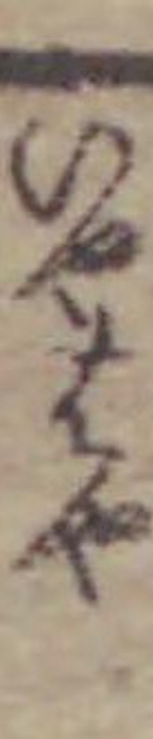いやはや
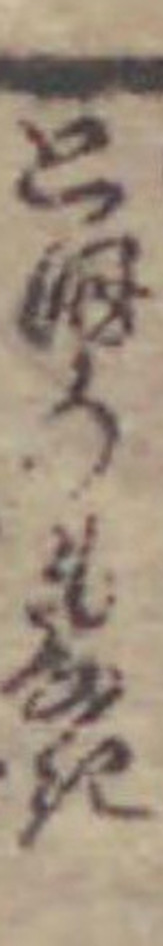とほうもなき
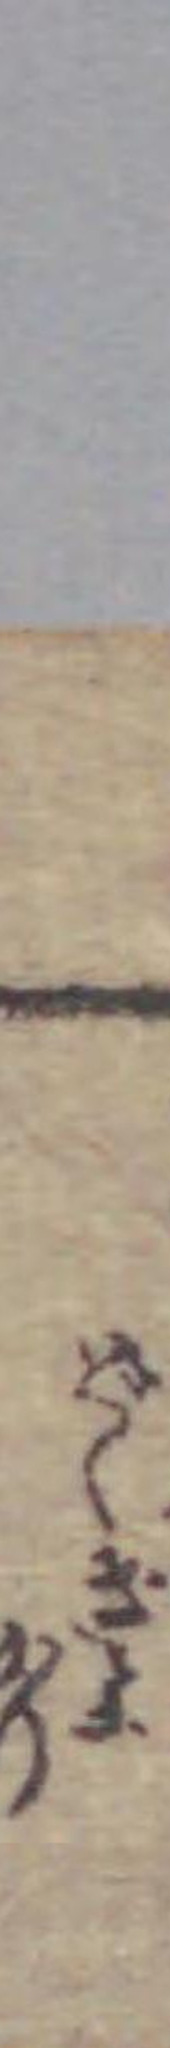どくぎよ
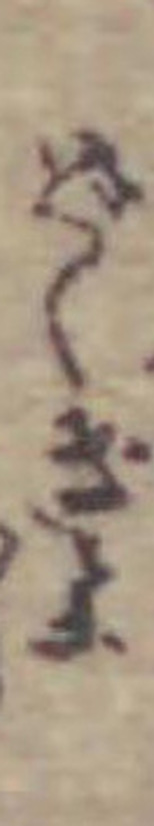どくぎよ
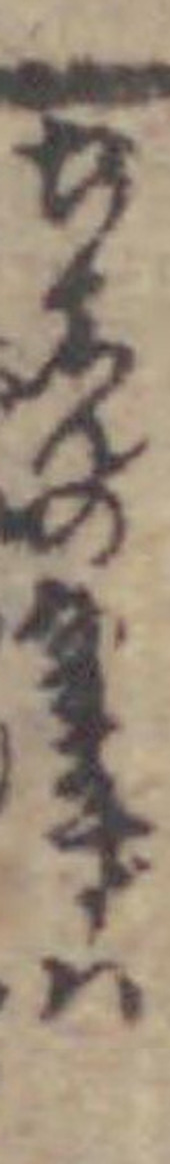ぢしんのなまずは
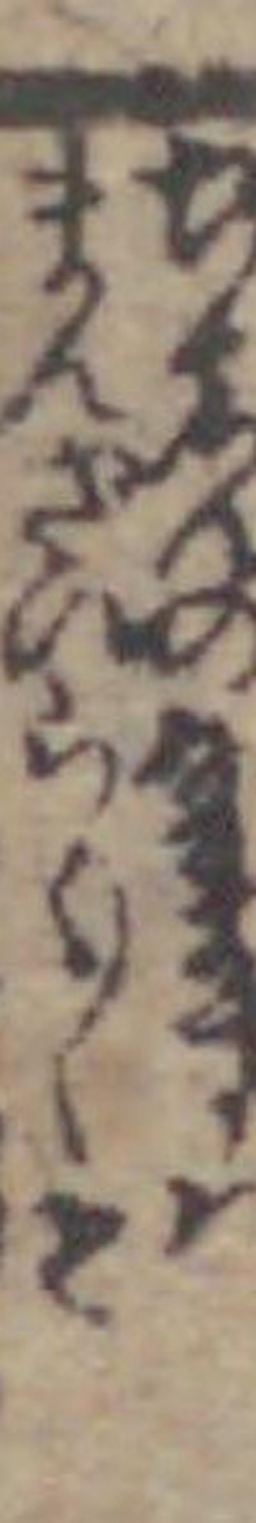まんざいらく〳〵と
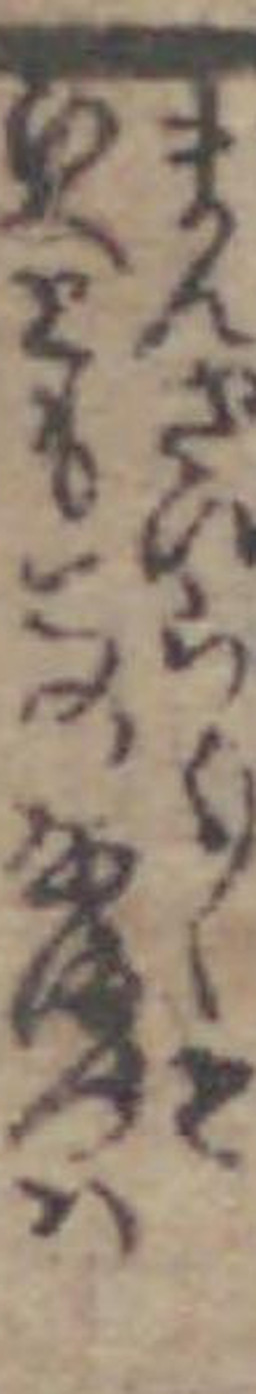いへともこのなまづは
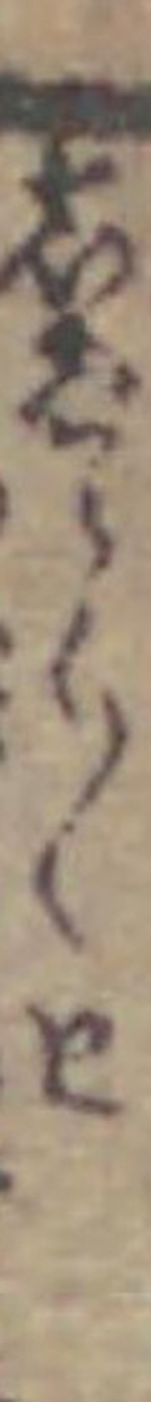しばらく〳〵と
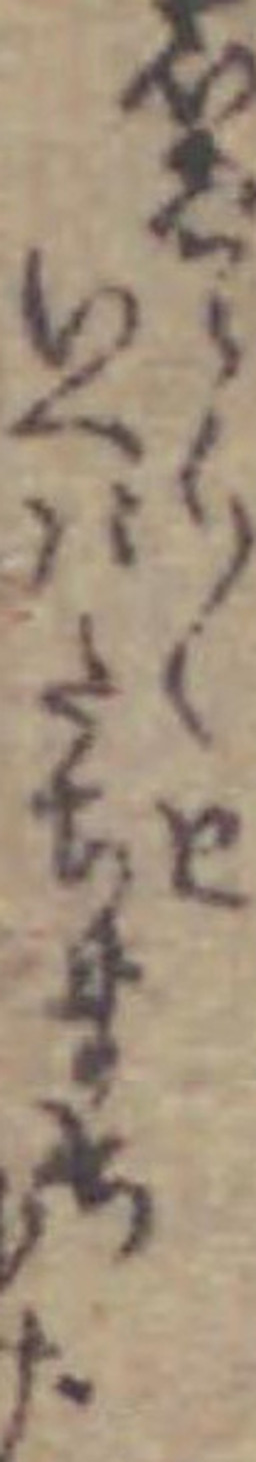いへばたちまち
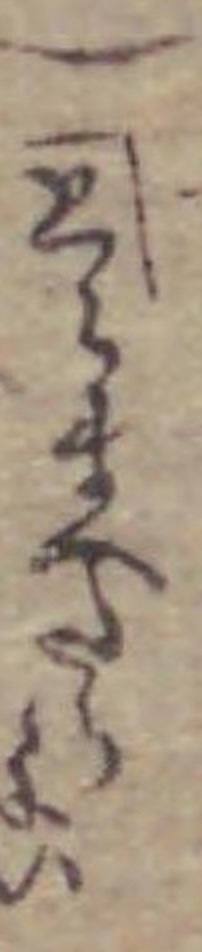〽とらまへたら
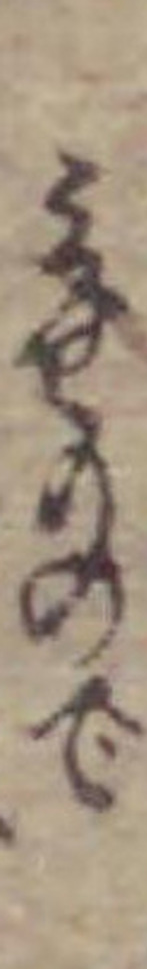みせもので
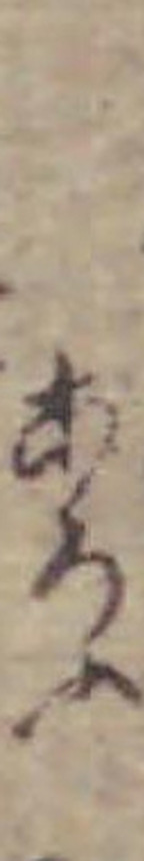あろふ
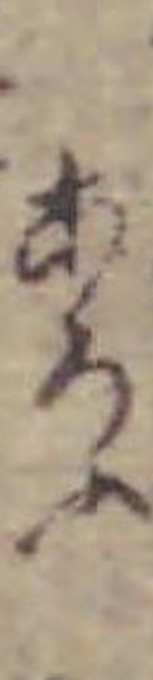あろふ
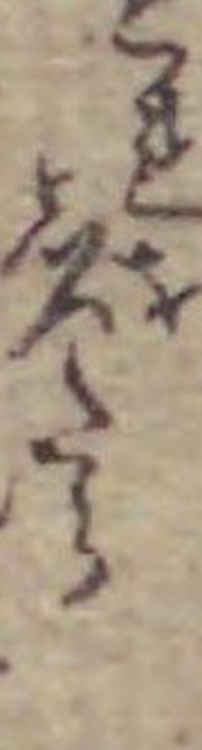しつたら
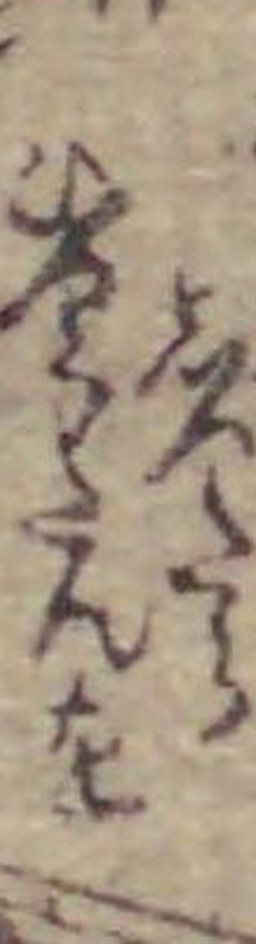ひやうたんを

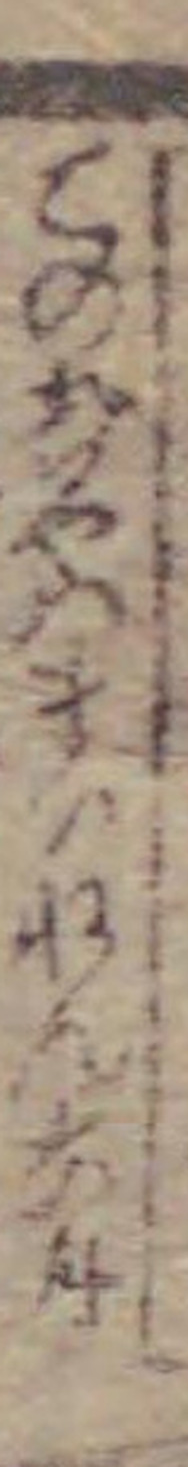このじやはまいねん六月
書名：化物和本草 : 3巻
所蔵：国立国会図書館 National Diet Library, JAPAN
